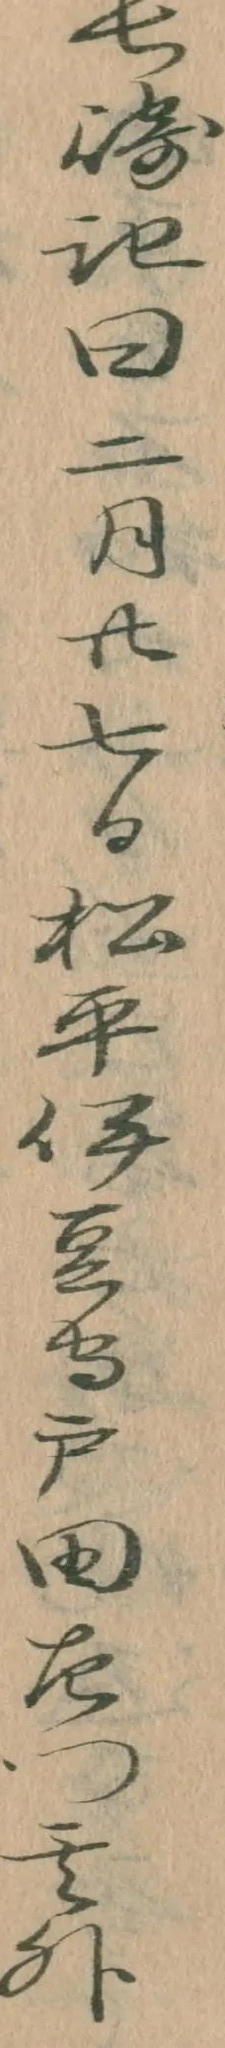長崎記曰二月廿七日松平伊豆守戸田左門其外
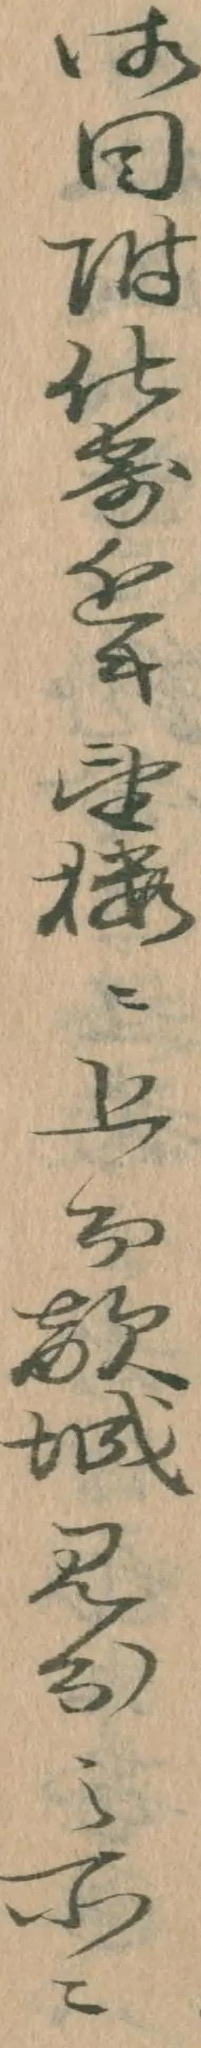御目附仕寄近き野樓に上而敵城見分之所に
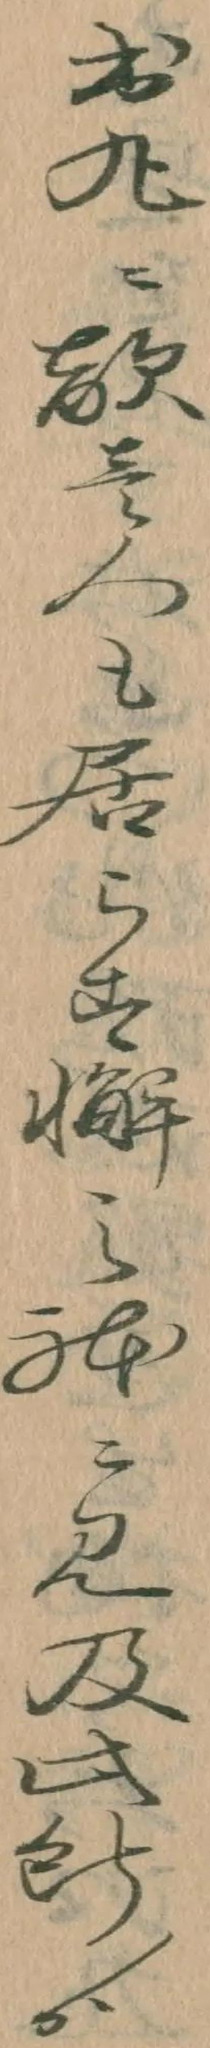出丸に敵壱人も居ら春懈之躰に見及此所ゟ
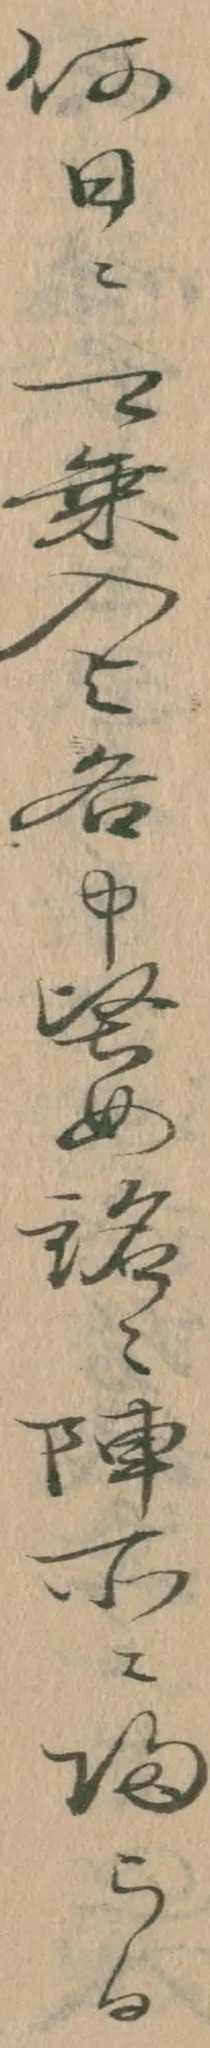何日に可乗入与各申堅め銘々陣所に帰らる
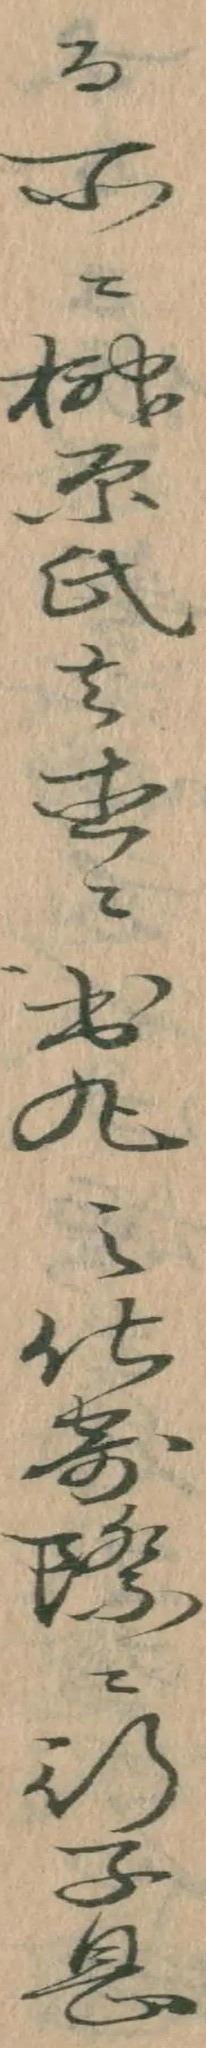る所に榊原氏者直に出丸之仕寄際に行子息
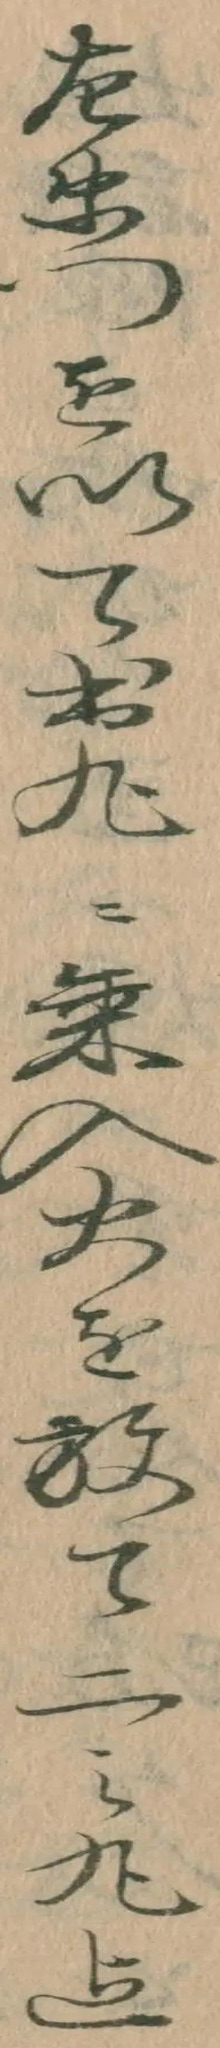左衛門を以て出丸に乗入火を放て二之丸迄
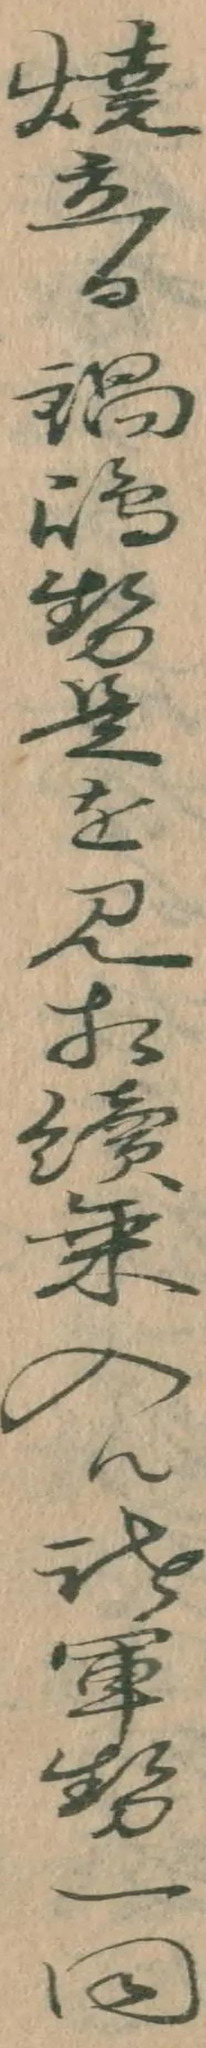焼立る鍋島勢是を見相続乗入候諸軍勢一同
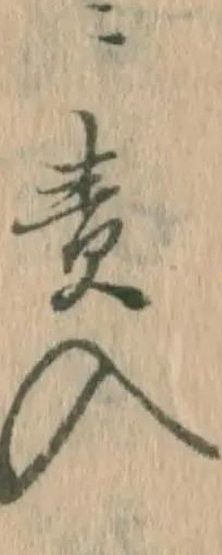に責入
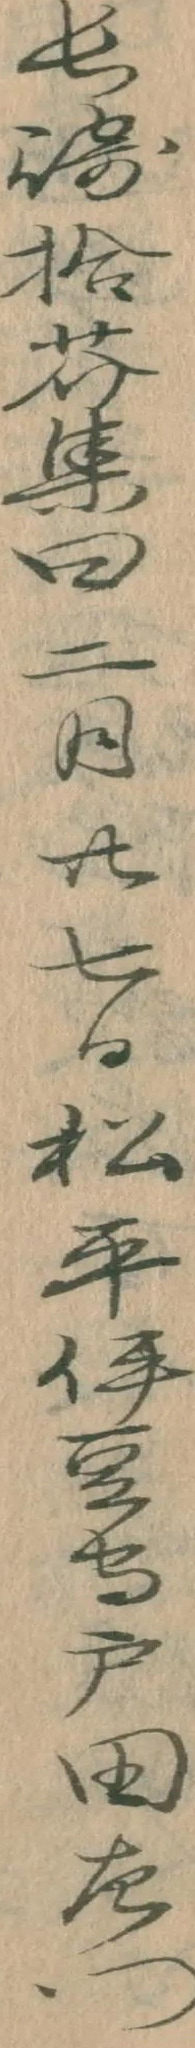長崎拾芥集曰二月廿七日松平伊豆守戸田左門
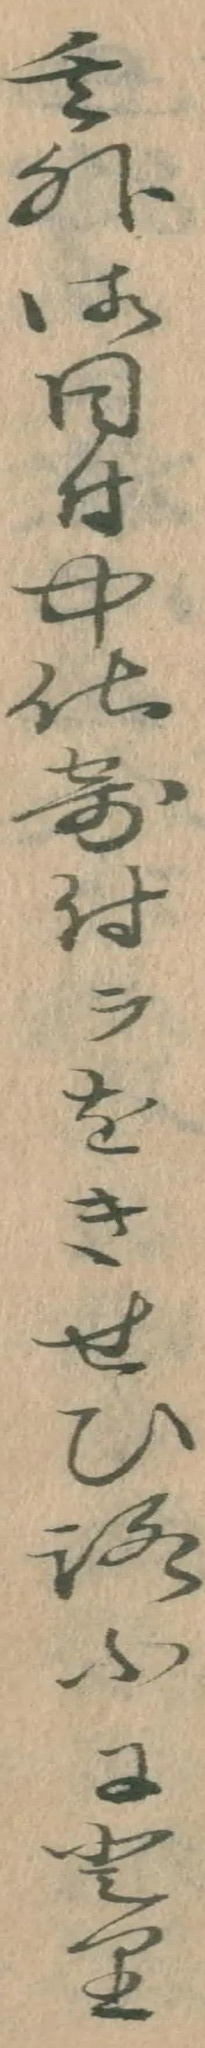其外御目付中仕寄付てをきせひ路ふ尓登里
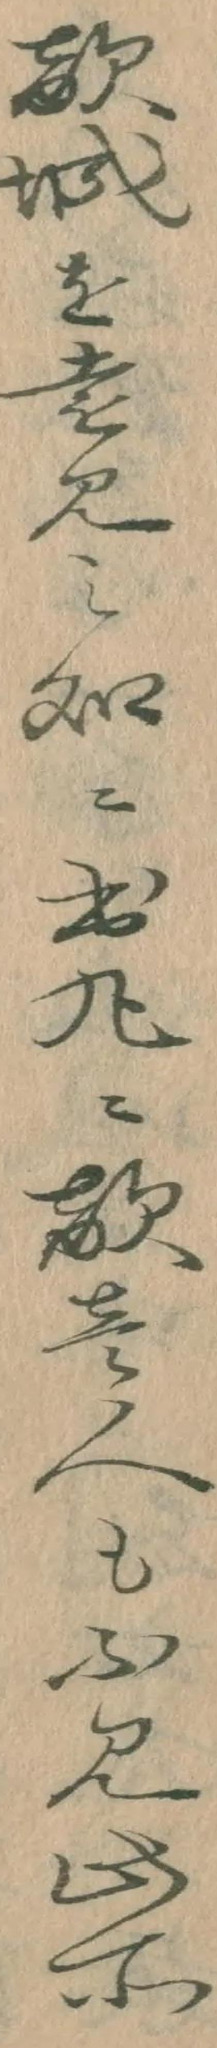敵城を遠見之処に出丸に敵壱人もふ見此所
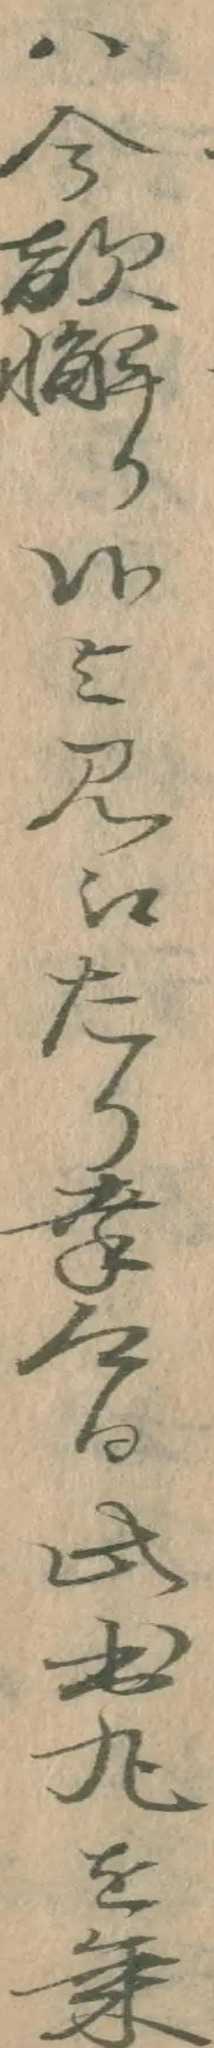は今敵懈り候与見江たり幸今日此出丸を乗
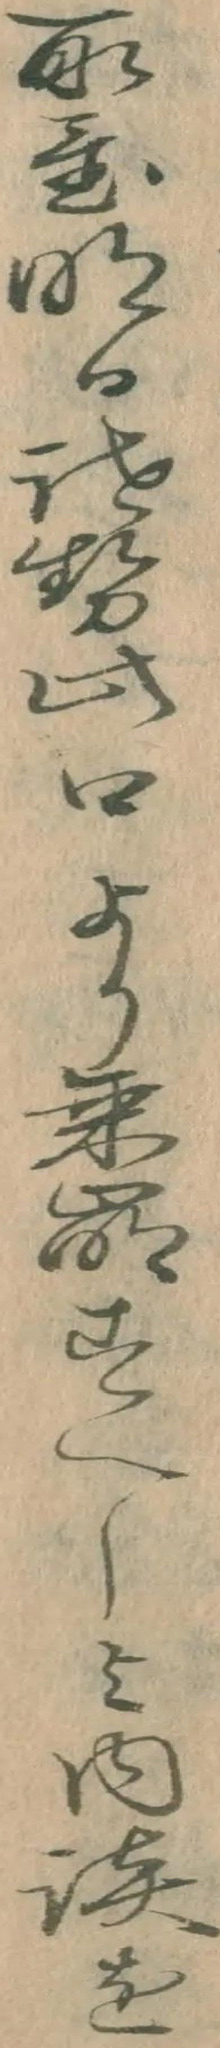取置明日諸勢此口より乗崩春へし与内談を

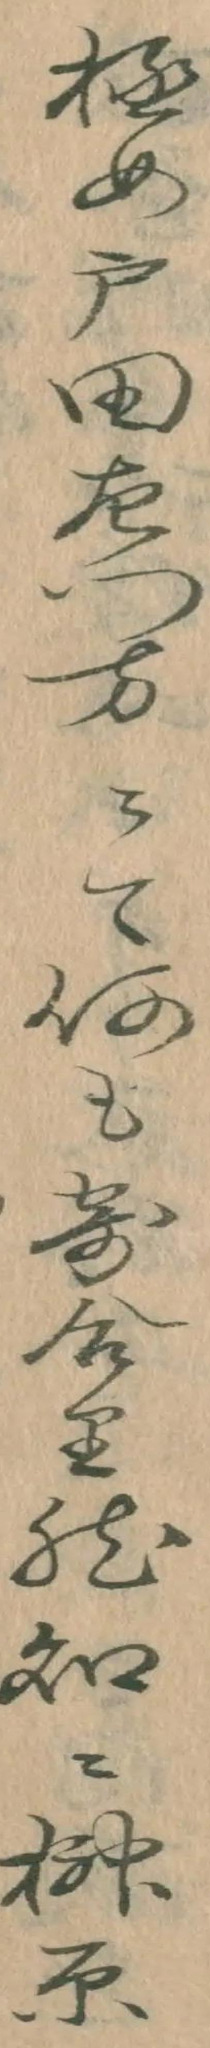極め戸田左門方にて何も寄合里然処に榊原
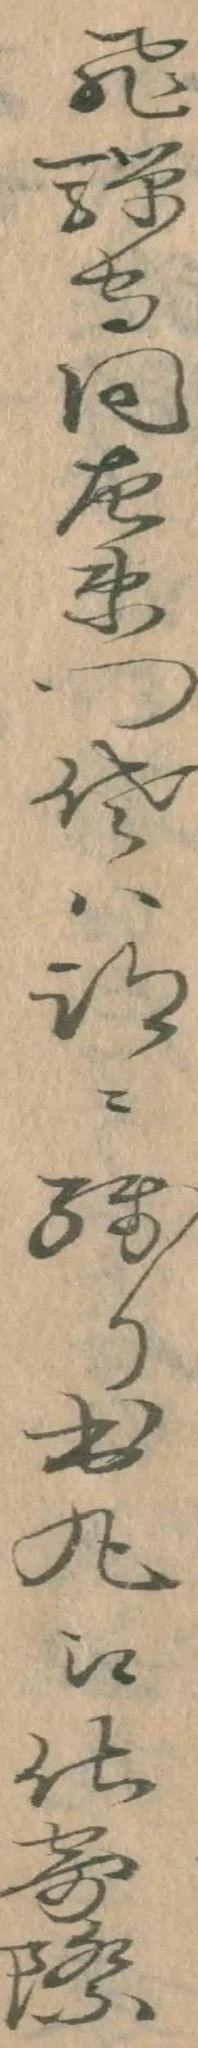飛騨守同左衛門佐は跡に残り出丸江仕寄際
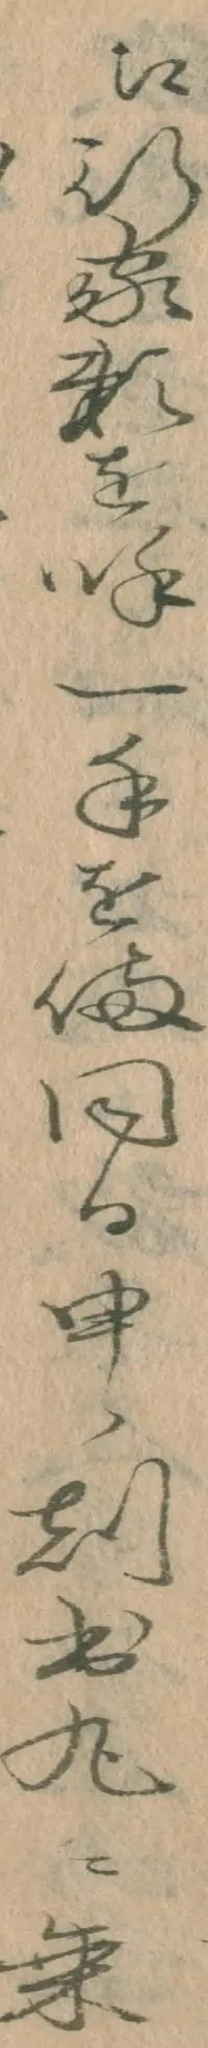江行家類を呼一手を備同日申之刻出丸に乗
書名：切支丹御退治記 49巻. [7]
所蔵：国立国会図書館 National Diet Library, JAPAN
